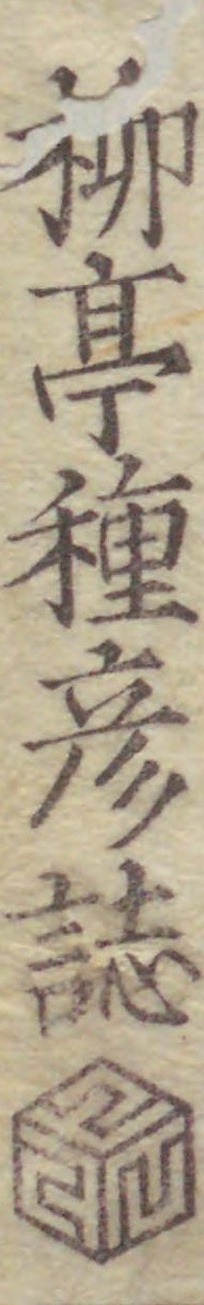柳亭種彦修辞

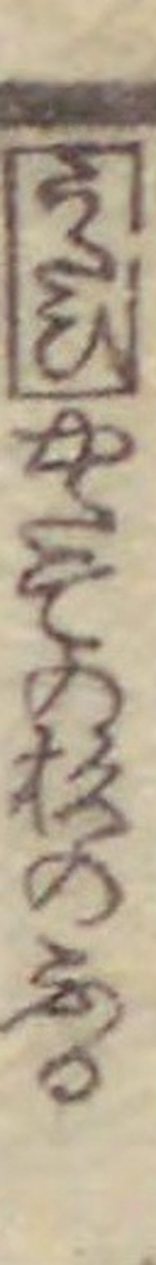うたひやたての杉のふる
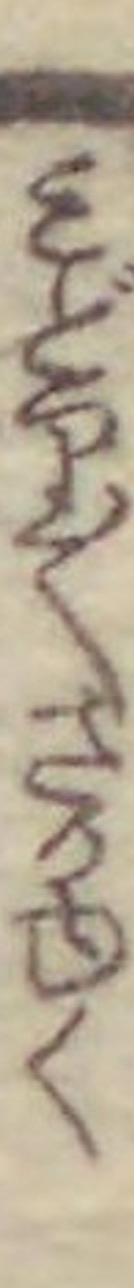どり〳〵さかゆ〳〵
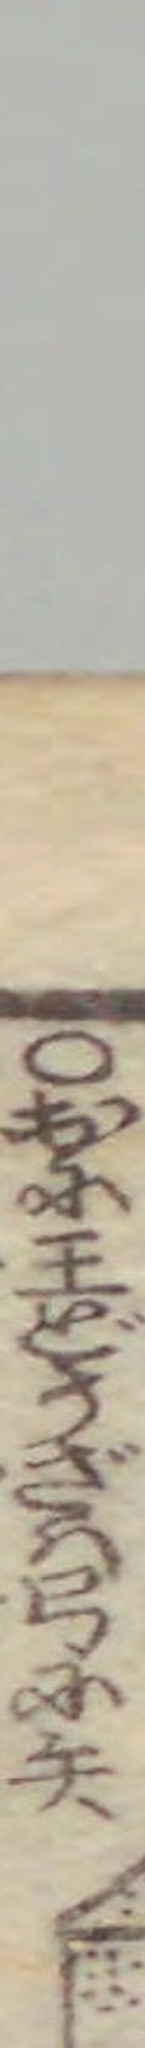○おに王どうざは弓に矢
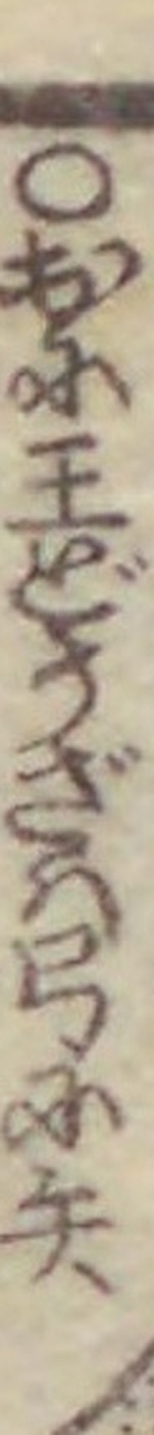○おに王どうざは弓に矢
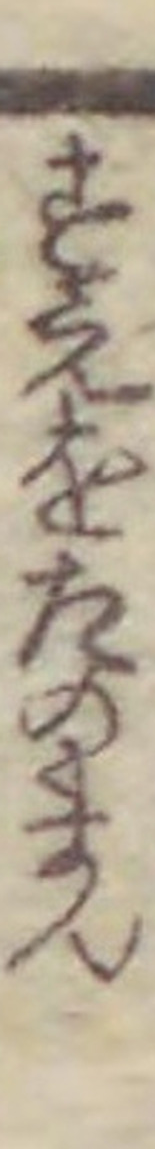すえをたのまん
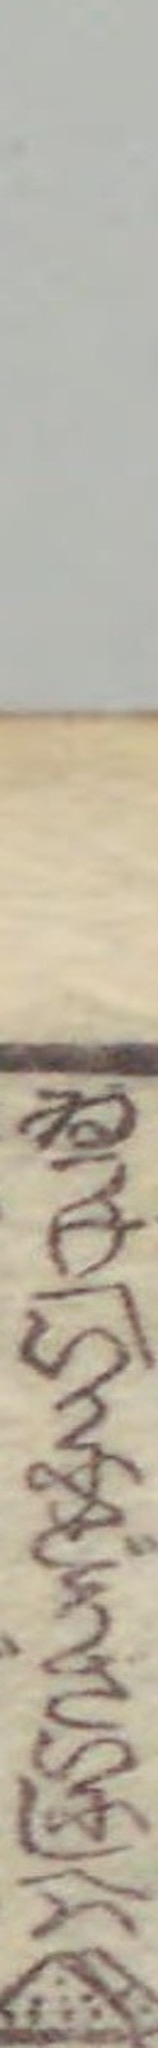ゐつけ〽いかにどうさいにしへは
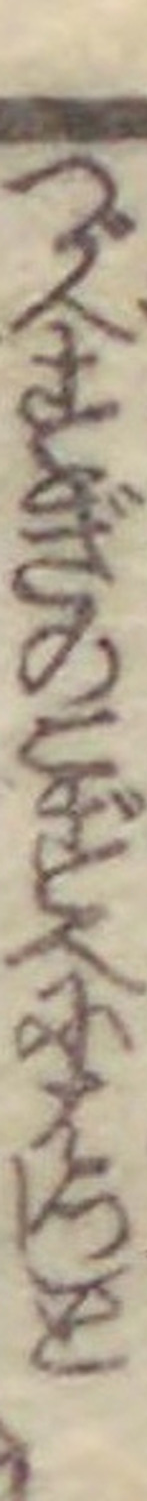つがへすぎのこずへにはつしと
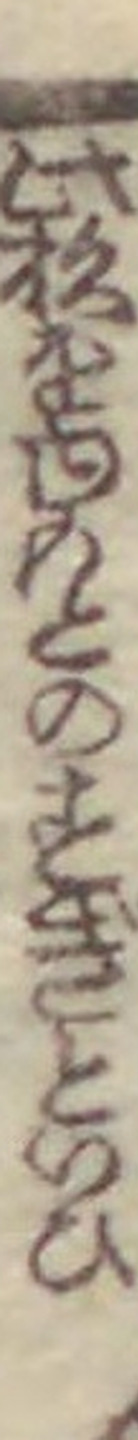此杉をゆもとのすぎといひ
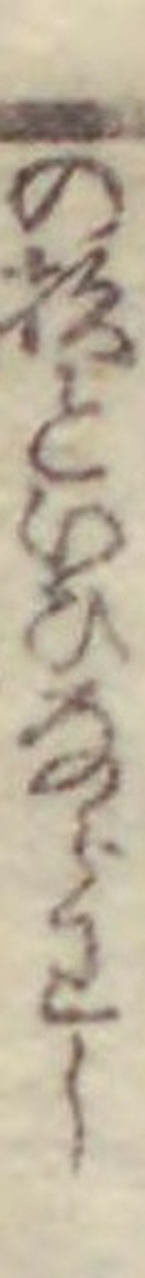の杉といひならわし
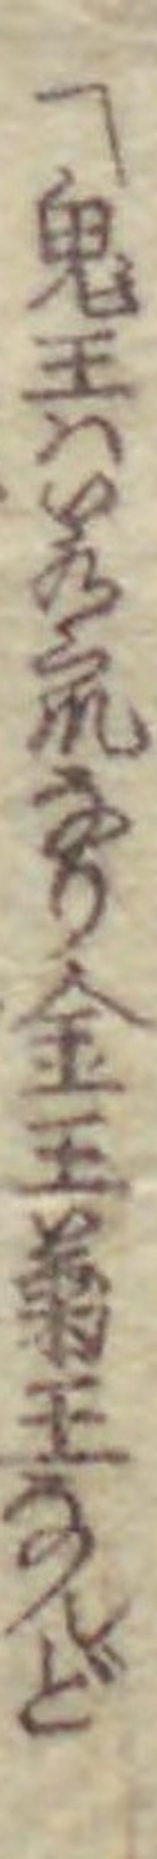〽鬼王は若衆なり金王菊王なんど
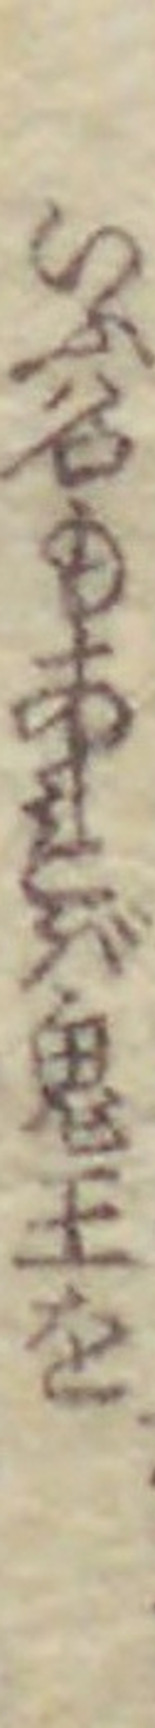いふ名もあれば鬼王を
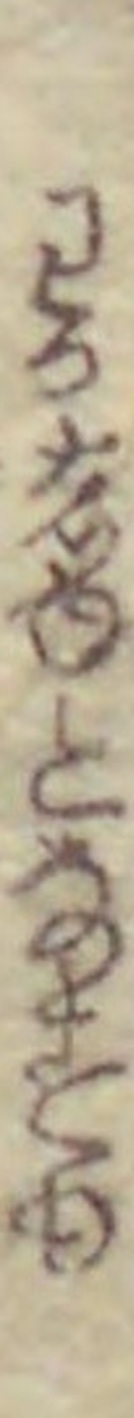わかしゆとなすも
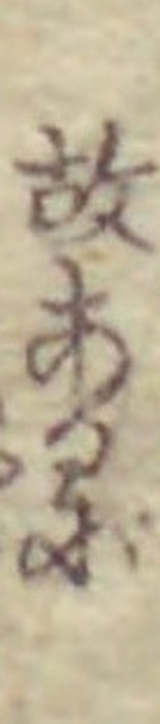故あるに
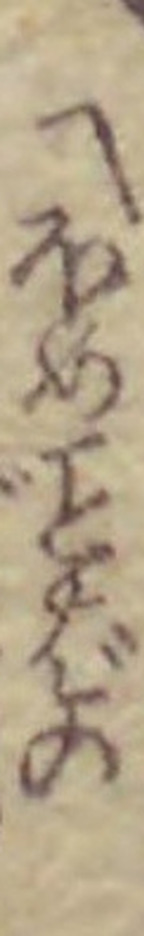〽ほめことばの
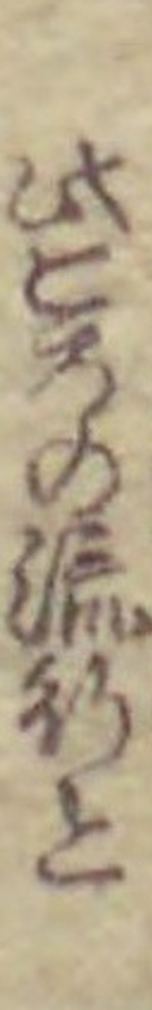此ころの流行と
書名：大時代唐土化物 3巻. 曽我太夫染
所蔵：国立国会図書館 National Diet Library, JAPAN
